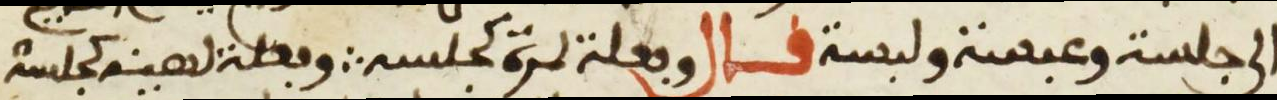الى جلسة و عبسة و لبسة قال و فعلة لمرة كجلسة و فعلة لهينه كجلسة
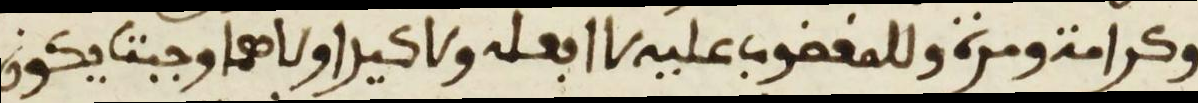و كرامة و مرة وللمغضوب عليه لا افعله و لا كيدا و لا هما و جئت يكون
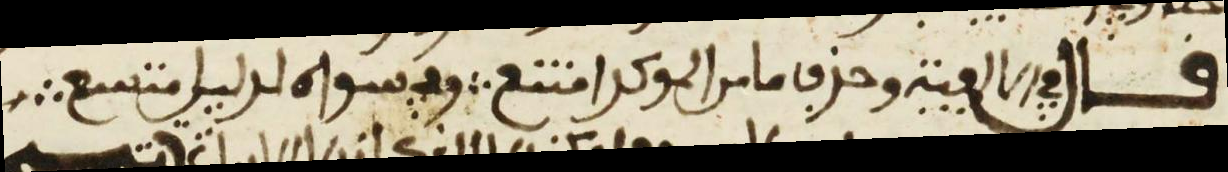قال في الالفية و حذف ما من الموكد امتنع و في سواه لدليل متسع
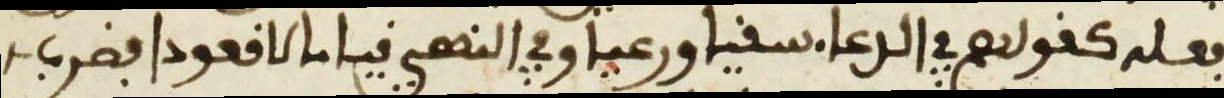فعله كقولهم في الدعاء سقيا و رعيا وفي النهي قياما لا قعودا فضرب
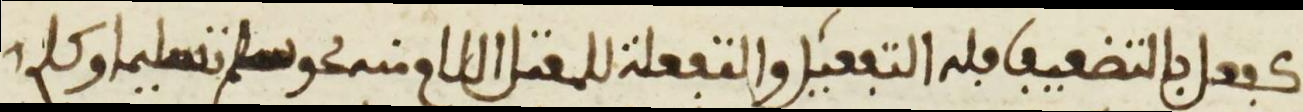كفعل بالتضعيف فله التفعيل و التفعلة للمعتل اللام منه نحو سلم تسليما و كلم
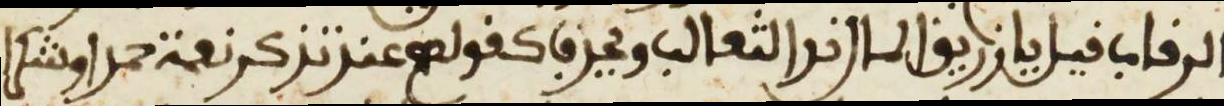الرقاب قيل يا زريق المال ذو الثعالب و يحذف كقولهم عند تذكر نعمة حمدا و شكرا
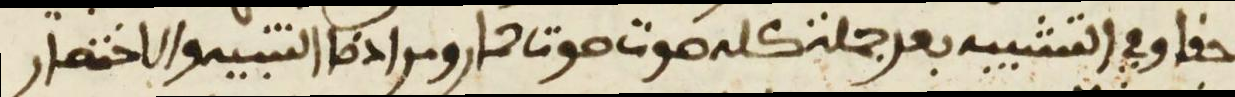حقا و في التشبيه بعد جملة كله صوت صوت حمار و مرادفا التنبيه و الاختصار
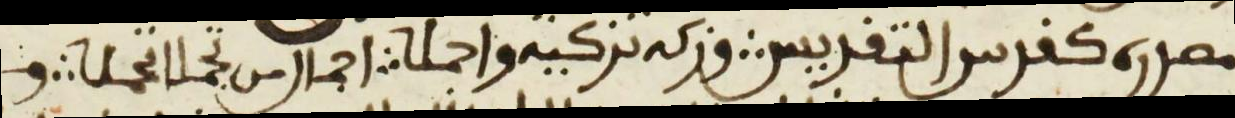مصدره كقدس التقديس و زكه تزكية و اجملا اجمال من تجملا تحملا و
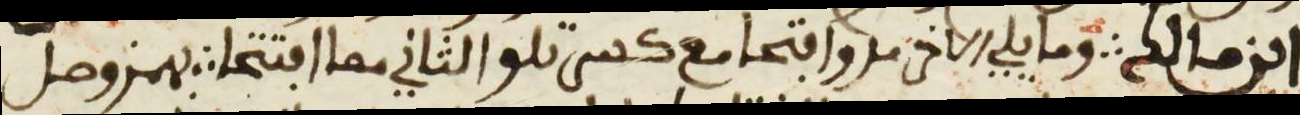ابن مالك و ما يلى الآخر مد وافتحا مع كسر تلو الثاني مما افتتحا بهمز وصل
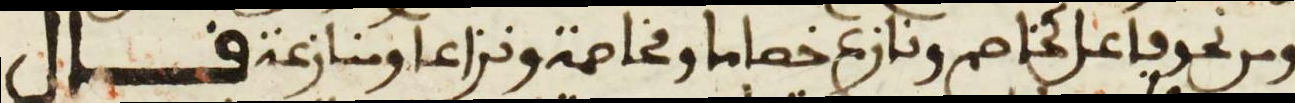و من نحو فاعل كخاصم و نازع خصاما و مخاصمة و نزاعا و منازعة قال
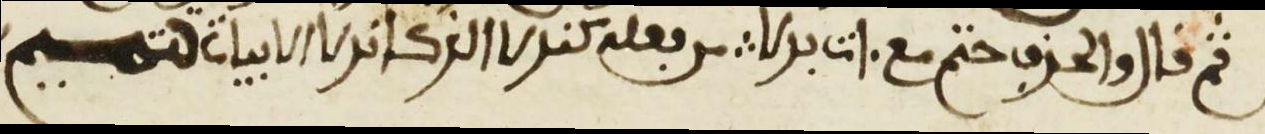ثم قال و الحذف حتم مع ءات بدلا من فعله كندلا الذ كاندلا الابيات تتميم
